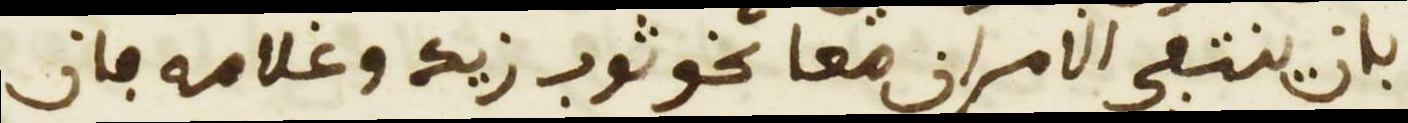بان ينتفي الامر ان معا نحو ثوب زيد و غلامه فان
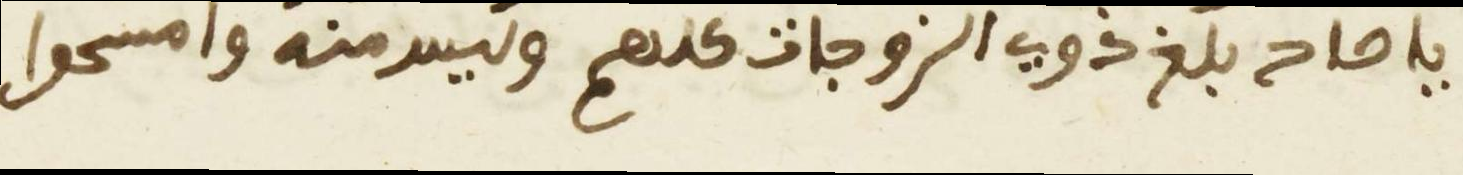يا صاح بلغ ذوي الزوجات كلهم وليس منه وامسحوا
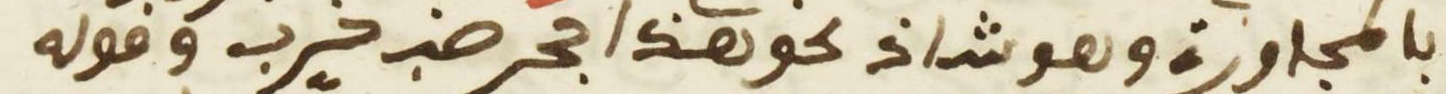يالمجاورة وهو شاذ نحو هذا حجر ضب خرب وقوله
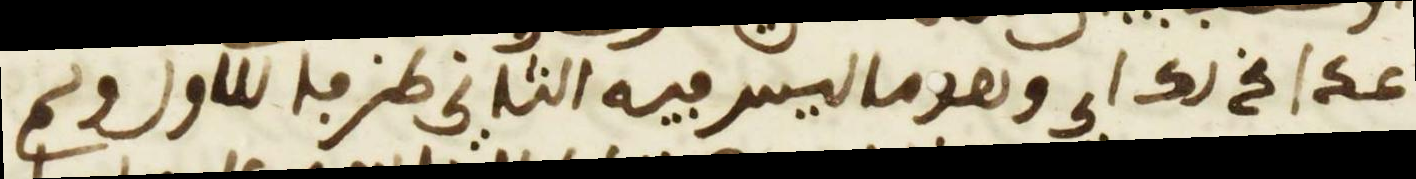عدا ذلك أي وهو ما ليس فيه الثاني ظرفا للاول ولم
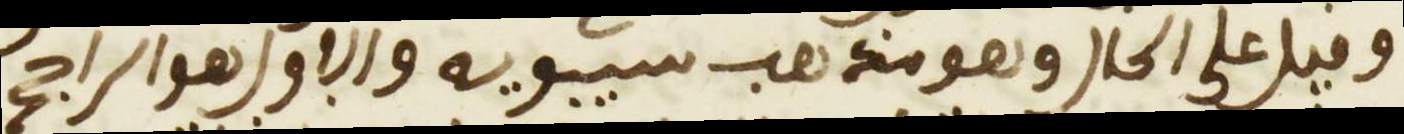وقيل على الحال وهو مذهب سيبويه والاول هو الراجح
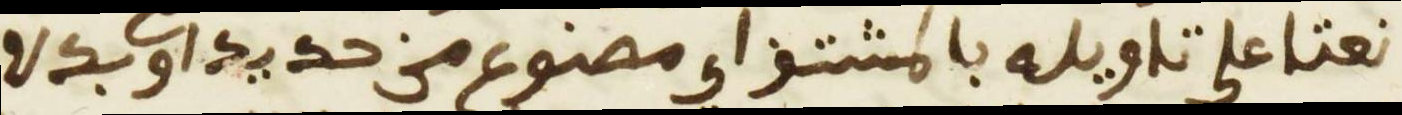نعتا على تاويله بالمشتق أي مصنوع من حديد او بدلا
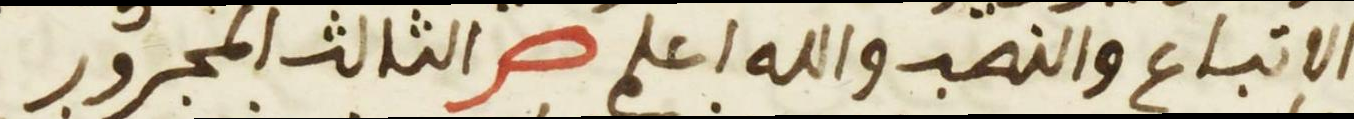الاتباع والنصب والله اعلم ص الثالث المجرور
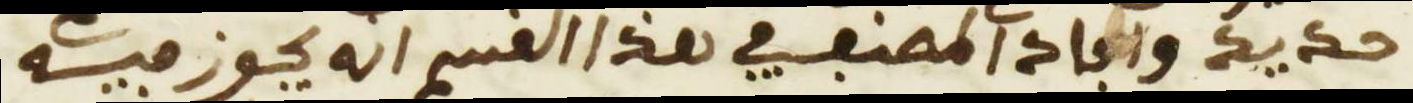حديد وافاد المصنف في هذا القسم انه يجوز فيه
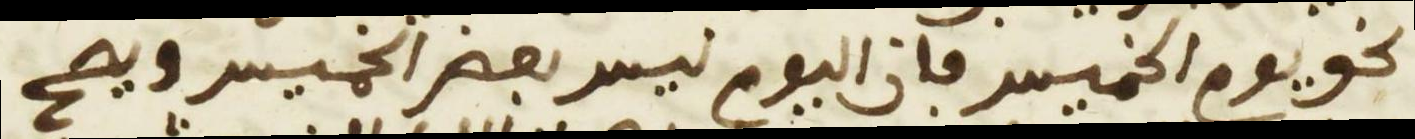نحو يوم الخميس فان اليوم ليس بعض الخميس ويصح
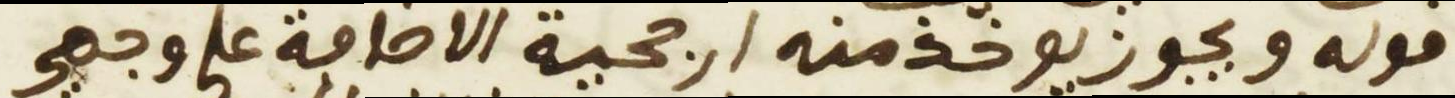قوله ويجوز يوخذ منه ارجحية الاضافة على وجهي
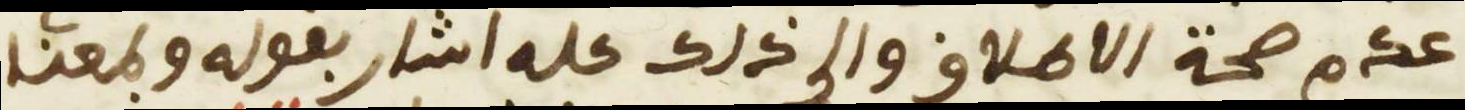عدم صحة الاطلاق والى ذلك كله اشار بقوله وبمعنا
